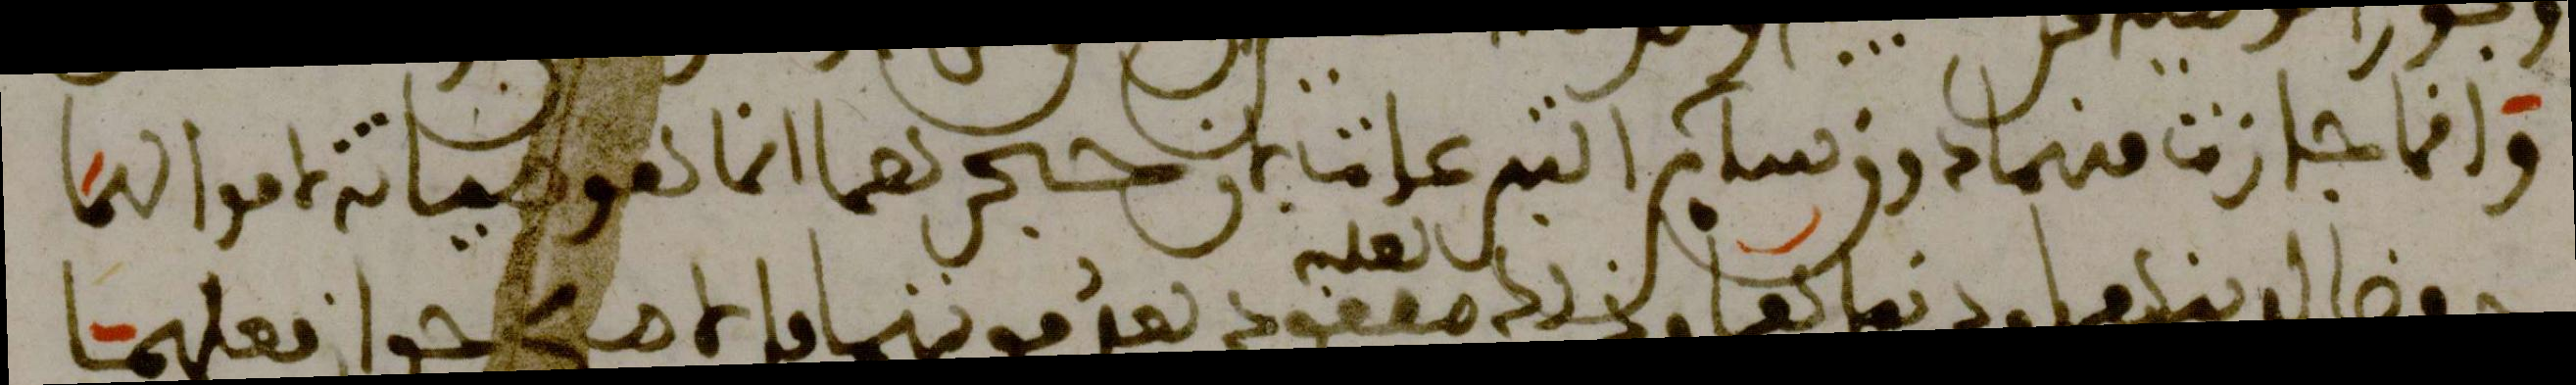وَانما جازت منها دون سائر التبرعات لان حجرهما انما هو صيانة لا موالهما
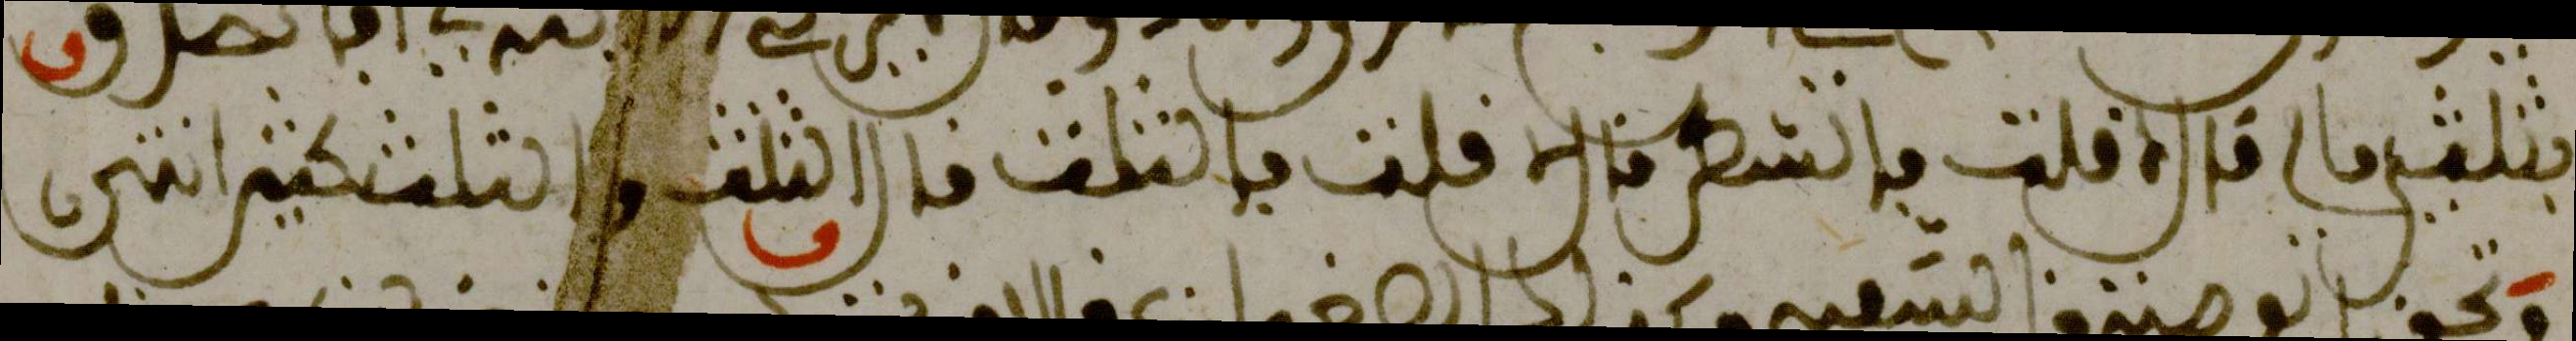بثلثي مالي قال لا قلت فالشطر قال لا قلت فالثلث قال الثلث والثلث كثير انتى
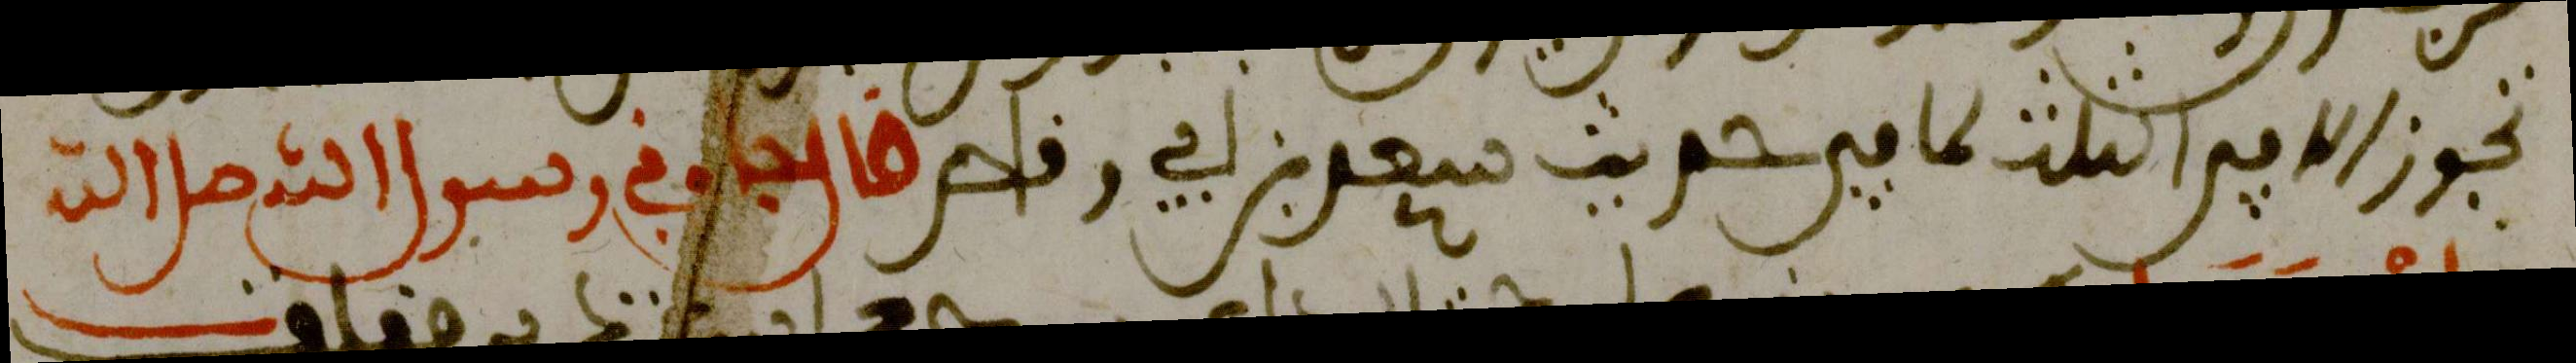تجوز الا في الثلث لما في حديث سعد بن ابي وقاص قال جاءني رسول الله صل الله
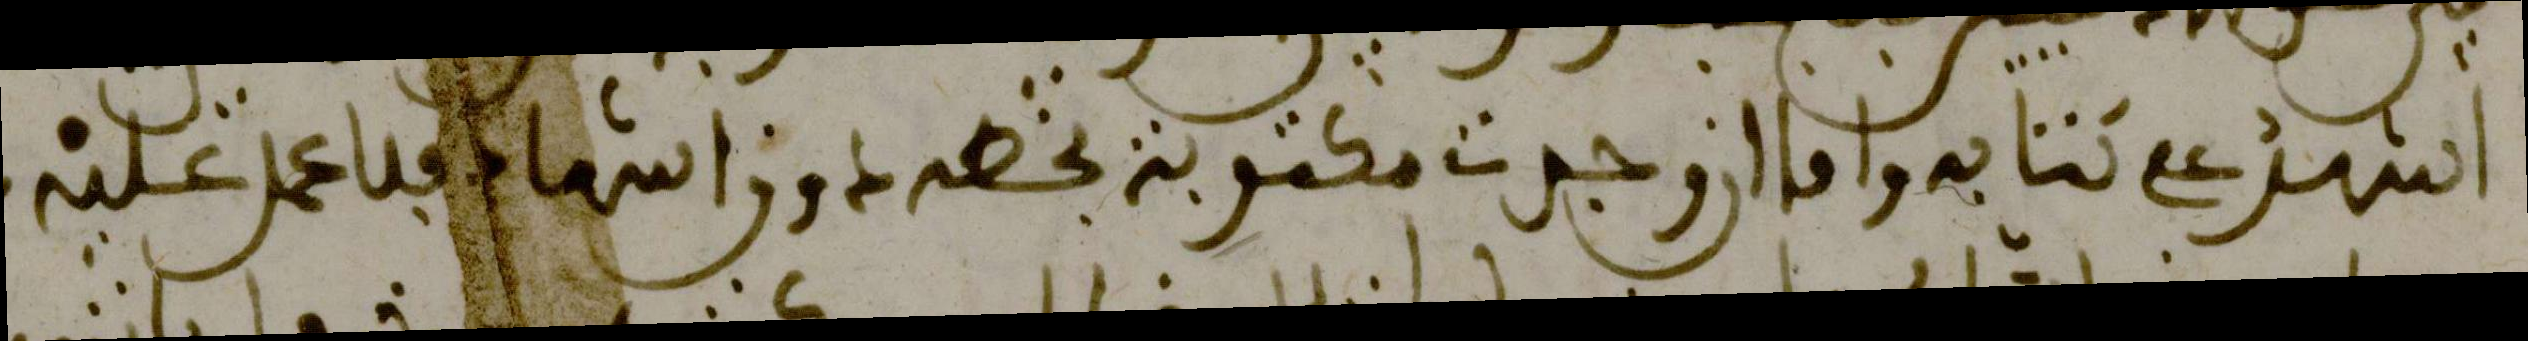اشهد على كتابه واما ان وجدت مكتوبة بخطه دون اشهاد فلا عمل عليْه
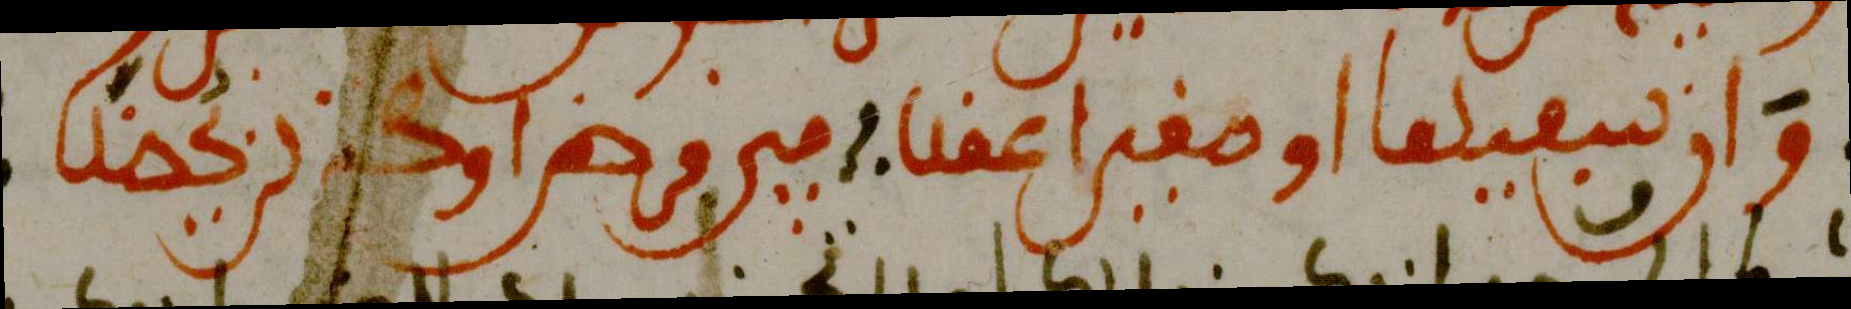وَان سفيها او صغيرا عقلا في فرض او صح لن يحضلا
